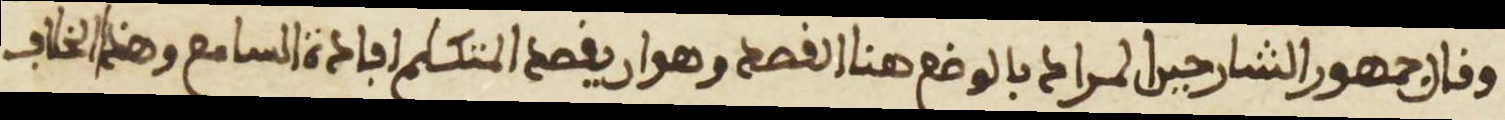و قال جمهور الشارحين المراد بالوضع هنا القصد و هو ان يقصد المتكلم افادة السامع و هذا الخلاف
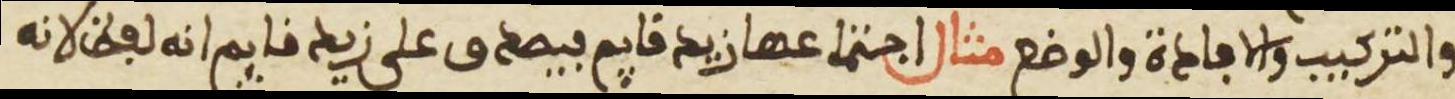و التركيب و الافادة و الوضع مثال اجتماعها زيد قايم فيصدق على زيد قايم انه لفظ لانه
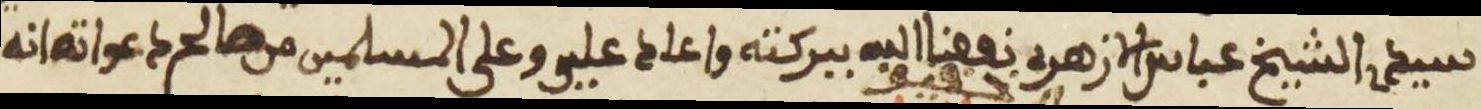سيدى الشيخ العباس الازهرى نفعنا الله ببركته و اعاد علي و على المسلمين من مصالح دعواته انه
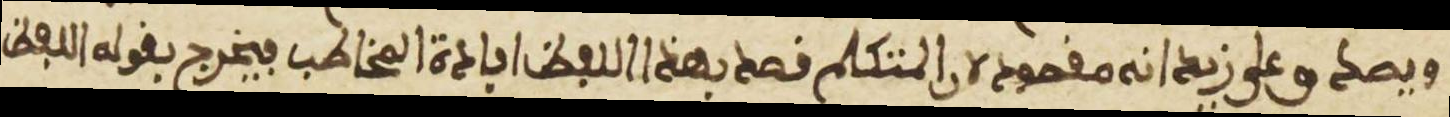و يصدق على زيد انه مقصود لان المتكلم قصد بهذا اللفظ افادة المخاطب فيخرج بقوله اللفظ
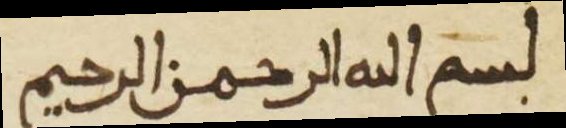بسم الله الرحمن الرحيم
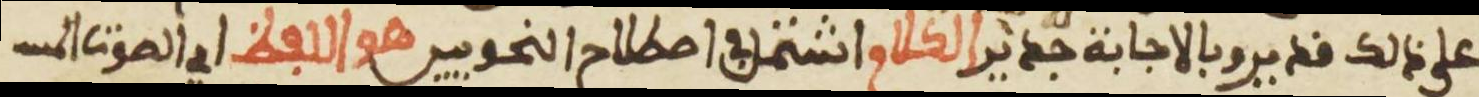على ذلك قدير و بالاجابة جدير الكلام اشتمل في اصطلاح النحويين هو اللفظ في الصوت المس
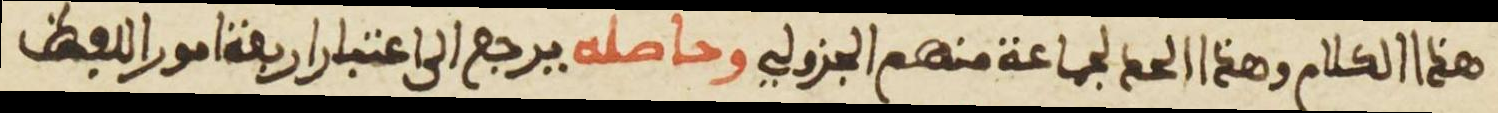هذا الكلام الحد لجماعة منهم الجزولي و حاصله يرجع الى اعتبار اربعة امور اللفظ
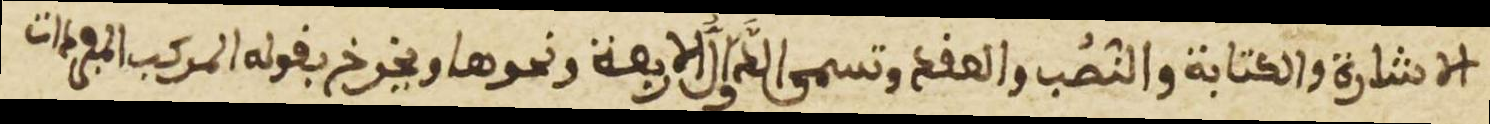الاشارة و الكتابة و النصب و العقد و تسمى الدوال الاربعة و نحوها و يخرخ المركب المفردات
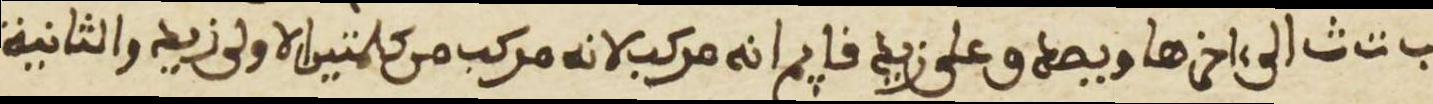ب ت ث الى اخرها و يصدق على زيد قايم انه مركب لانه مركب من كلمتين الاولى زيد و الثانية
